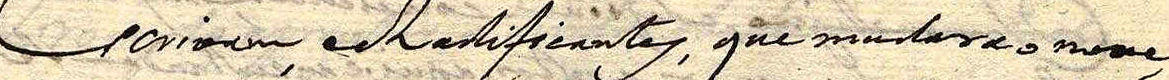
Escrivam, e Ratificantes, que mudara o nome,
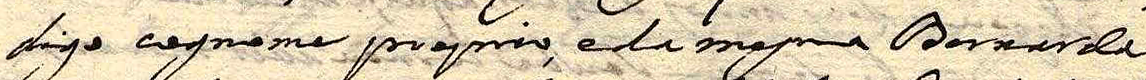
digo cognome proprio, e da mesma Bernarda
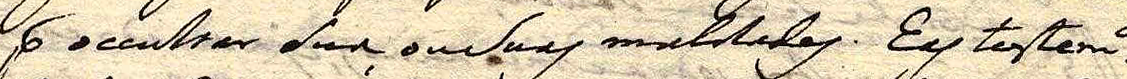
p̄ ocultar sua, ou suas maldades. E as testem.as
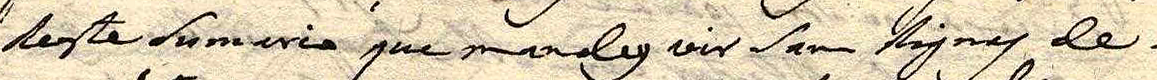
deste sumario que mandey vir sam dignas de
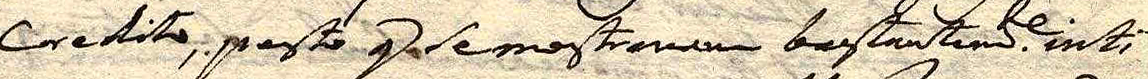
credito, posto q̄ se mostravam bastantem.te inti
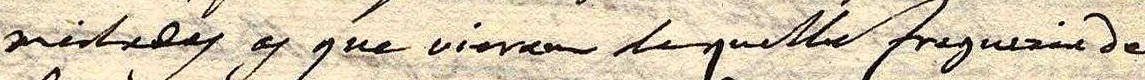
midadas os que vieram daquella freguezia de
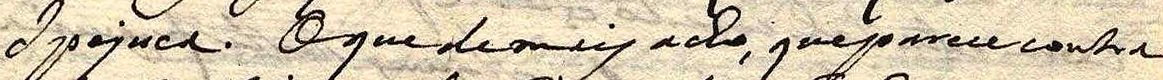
Ipejuca. O que demais acho, que parece contra
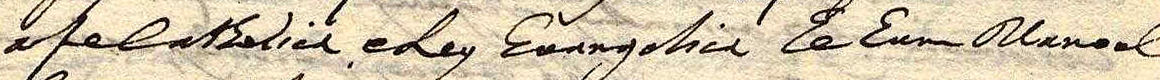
a fe Catholica, e Ley Evangelica he hum Manoel
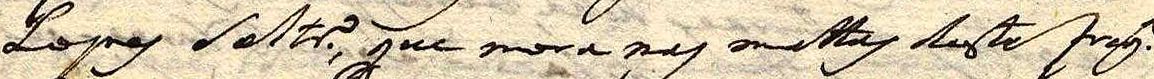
Lopes Soltr.o, que mora nas mattas desta freg.a
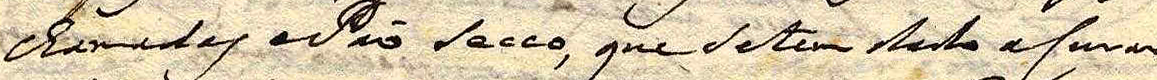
chamadas o Paõ secco, que se tem dado a Curar
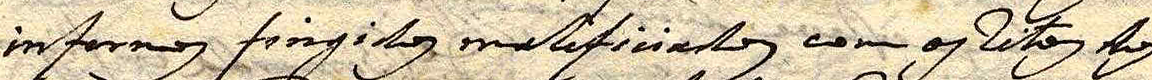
infermos fingidos maleficiados com os Ritos Aos
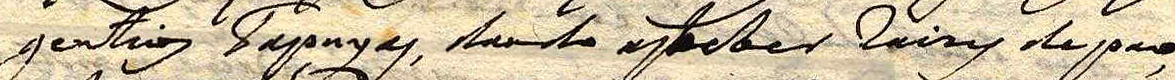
gentios Tapuyas, dando a saber Raizes de pao
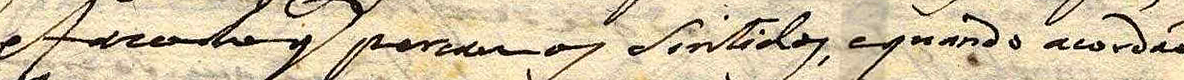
e fazendo q̄ percam os sintidos, e quando acordão
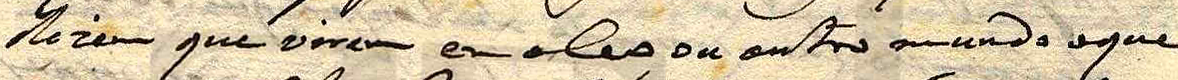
dizem que virem em o Ceo, ou outro mundo o que
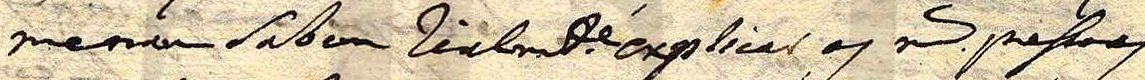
menos sabem Rialmt.e explicar as ms. pessoas
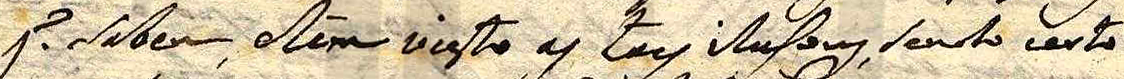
p̄ saber, além visto as tais ilusons, sendo certo
